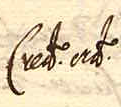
Cred̄.o ord̄.o
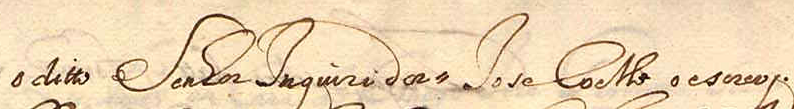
o ditto Senhor Inquizidor Iose Coello o escrevj.
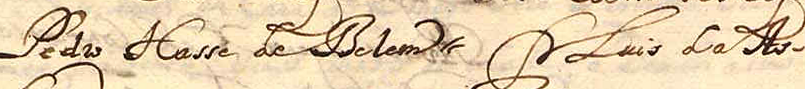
Pedro Hasse de Belem// fr Luis da As
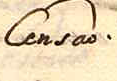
Censaõ.
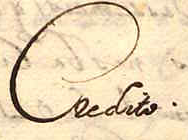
Credito.
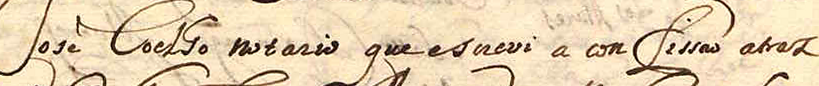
Jose Coelho notario que escrevi a confissaõ atraz
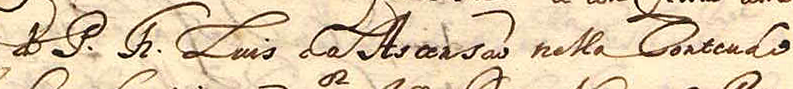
do P. Fr. Luis da Ascensaõ nella Conteudo
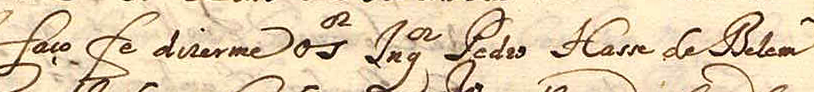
faço fe dizerme o sor Inqor Pedro Hasse de Belem
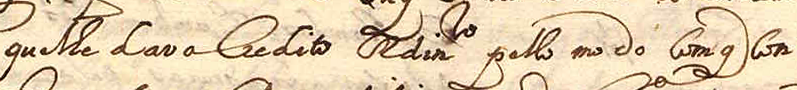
que lhe dava Credito Ordinro pello modo Com q̄ Con
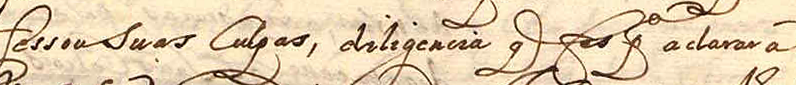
fessou suas Culpas, diligencia q̄ fes pa aclarar a
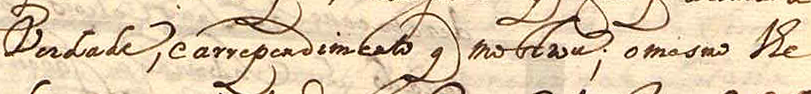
Verdade, e arrependimento q̄ mostrou; o mesmo lhe
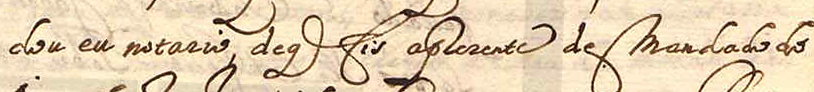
dou eu notario, de q̄ fis a pRezente de mandado do
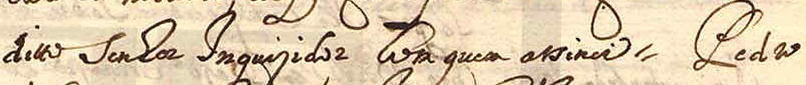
ditto Senhor Inquizidor Com quem assinei // Pedro
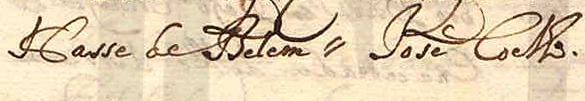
Hasse de Belem // Iosé Coelho.
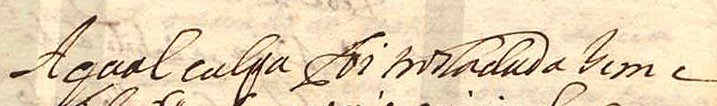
A qual culpa foi tresladada bem e
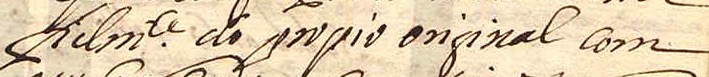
fielm.te do propio original com
